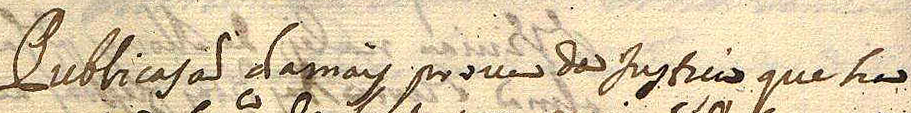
Publicasaõ da mais proua da Justiça que ha
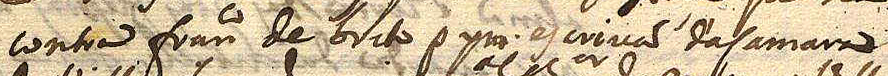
contra franco de brito p xn. escriuaõ da Camara
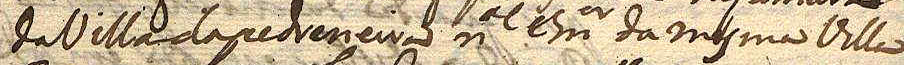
da Villa da pedreneira nal E mor da mesma Villa
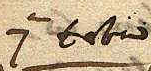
7a testa
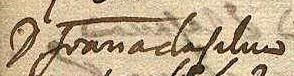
D Joana da silua
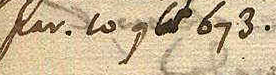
par. 10 9bro 673.
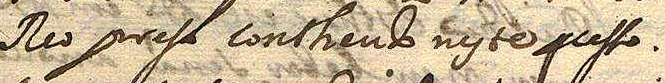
Reo preso contheudo neste ꝓcesso.
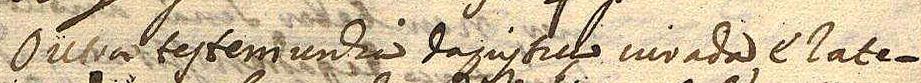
Outra testemunha da justiça iurada, e Rate
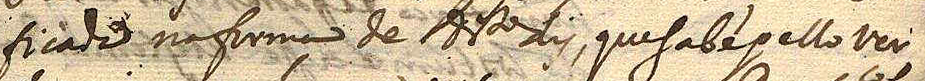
ficada na forma de drto dis, que sabe pello ver,
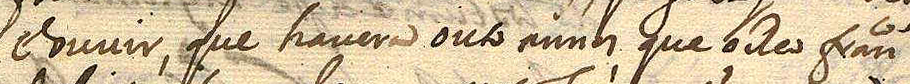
E ouuir, que hauera outo annos que o Reo franco
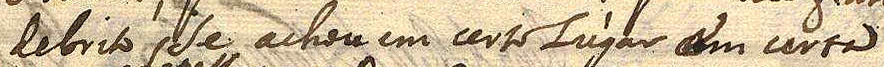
de brito se achou em certo Lugar em certa
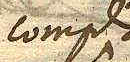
compa
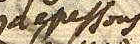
de pessoas
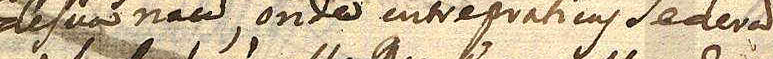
de sua naçaõ, onde entre praticas se deraõ
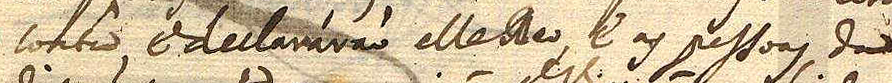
conta, E declararão elle Reo, E as pessoas da
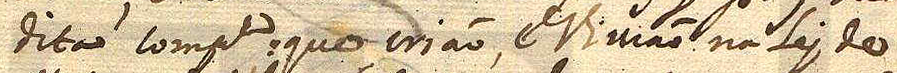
dita compa que criaõ, E Viuiaõ na Lej de
